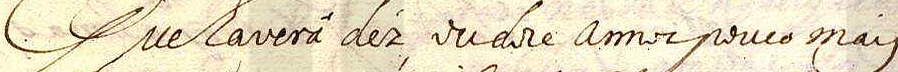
Que haverá dez, ou doze annos pouco mais
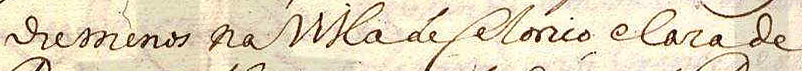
ou menos na Villa de Celorico, e Caza de
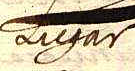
Lugar
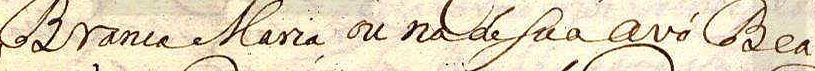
Branca Maria, ou na de sua avó Bea
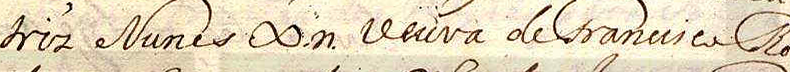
triz Nunes x. n. veuva de Francisco Ro
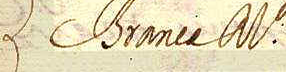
Branca M.a
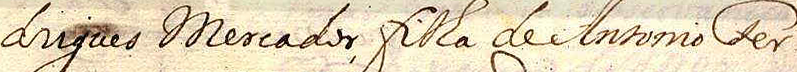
drigues Mercador, filha de Antonio Fer
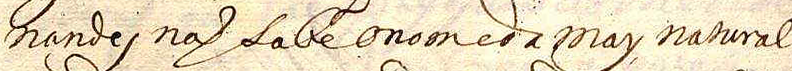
nandes naõ sabe o nome da may, natural
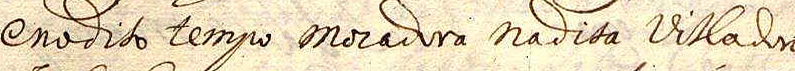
e no dito tempo moradora na dita Villa don
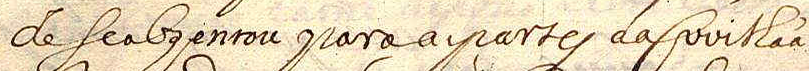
de se abzentou para as partes da Covilhaã
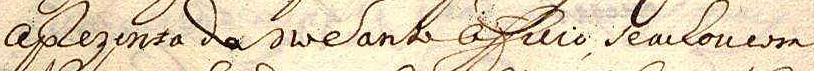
apRezentada ao Santo officio, se achou com
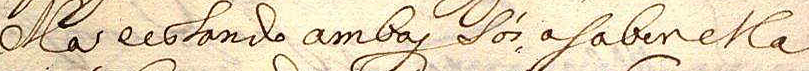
ella e estando ambas sós, a saber ella
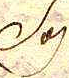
Sos
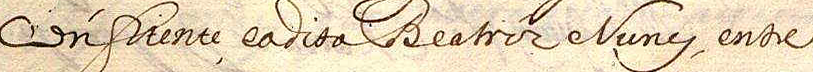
Confitente, e a dita Beatriz Nunes, entre
